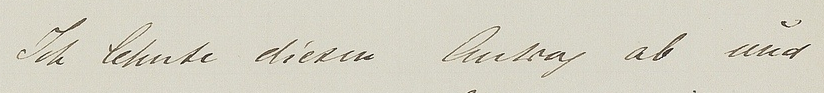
Ich lehnte diesen Antrag ab und
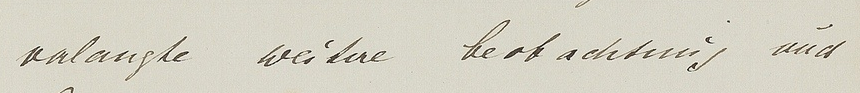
verlangte weitere Beobachtung und
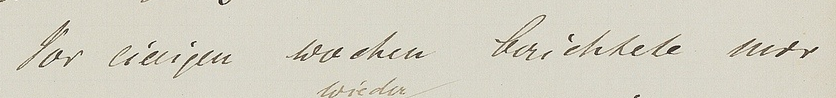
Vor einigen Wochen berichtete mir
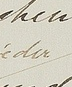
Herr
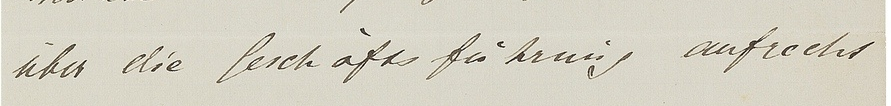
über die Geschäftsführung aufrecht
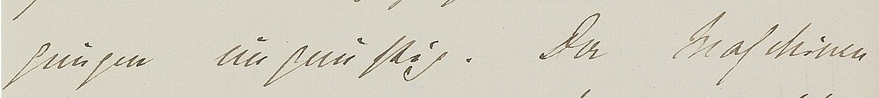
gungen ungünstig. Der Maschinen-
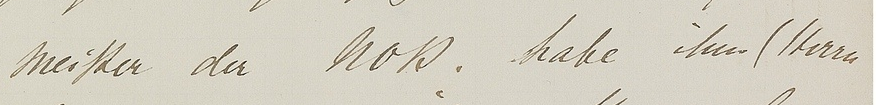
Meister der NOB. habe ihm (Herrn
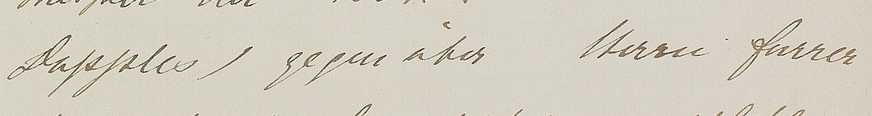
Dapples) gegenüber Herrn Furrer
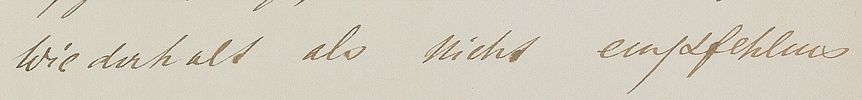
wiederholt als nicht empfehlens
